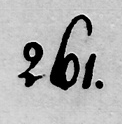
s¬
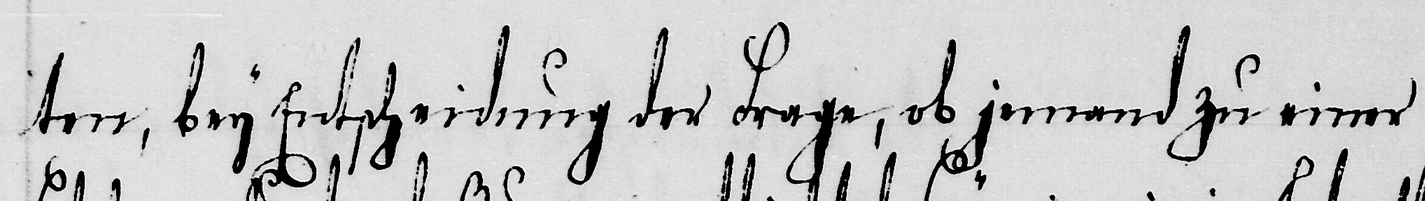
ten, bey Entscheidung der Frage, ob jemand zu einer
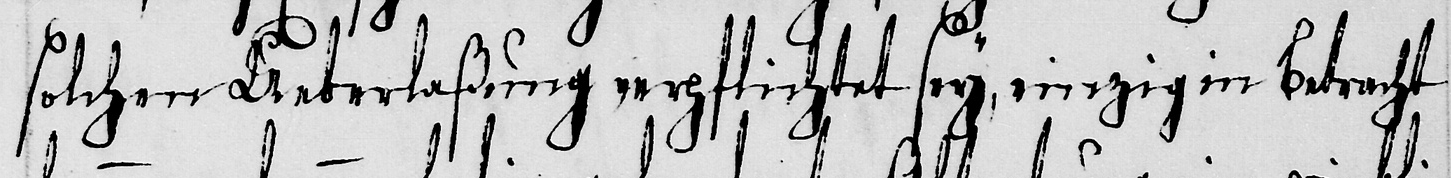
solchen Ueberlaßung verpflichtet sey, einzig in Betracht
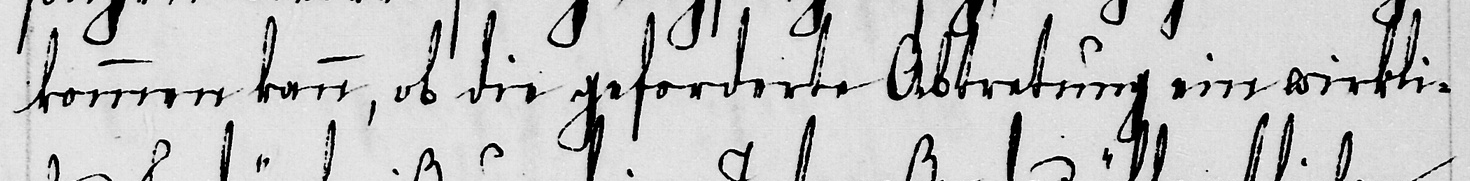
kommen kann, ob die geforderte Abtretung ein wirkli¬
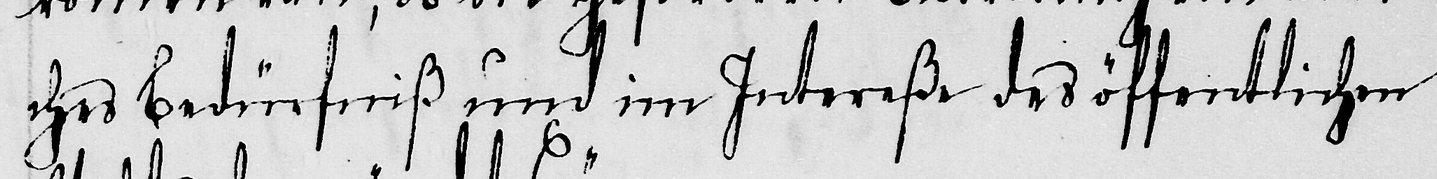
ches Bedürfniß und im Intereße des öffentlichen
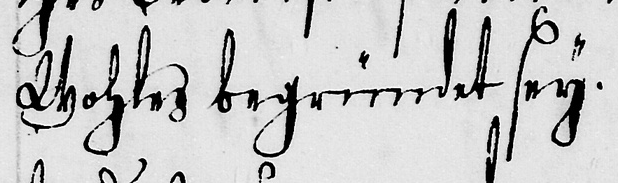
Wohles begründet sey.
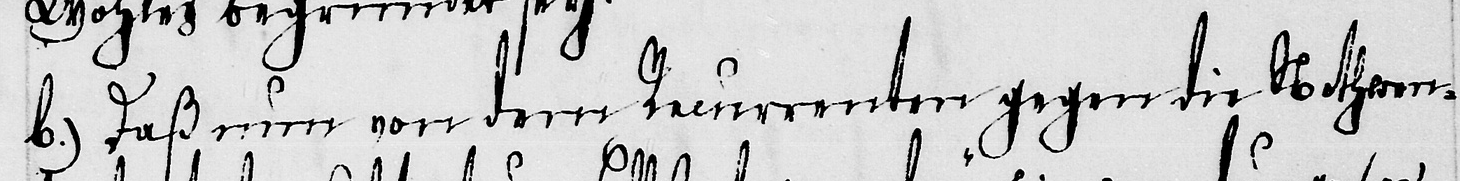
b.) Daß nun von dem Recurrenten gegen die Nothwen¬
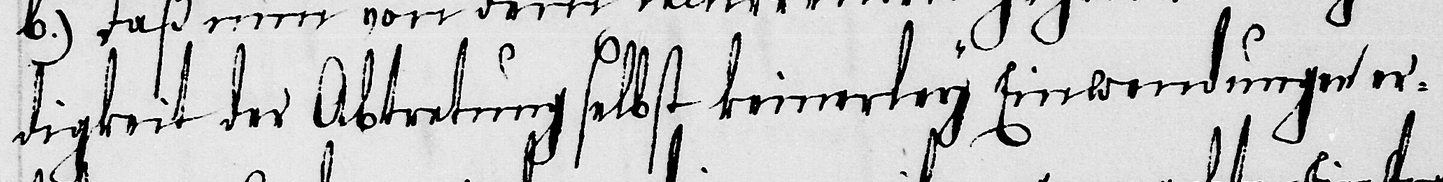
digkeit der Abtretung selbst keinerley Einwendungen er¬
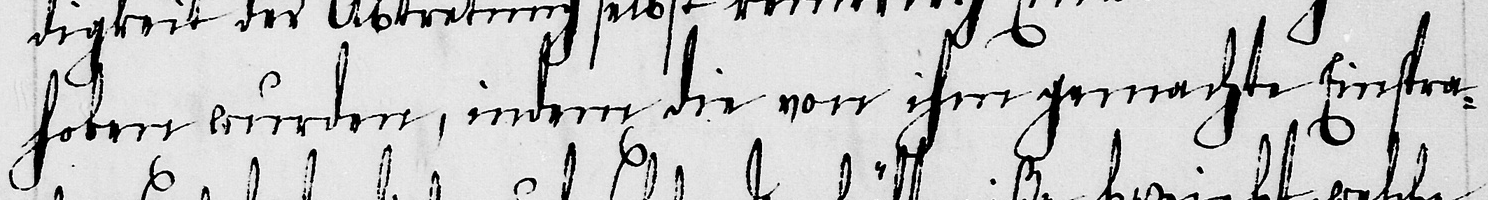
hoben wurden, indem die von ihm gemachte Einsprac¬
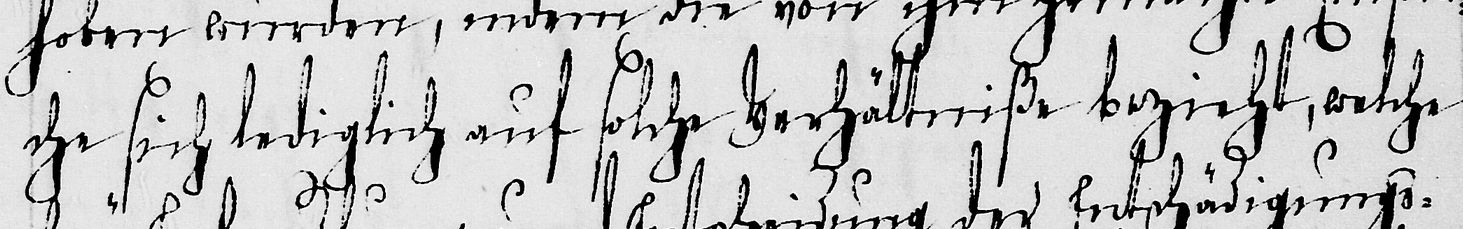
he sich lediglich auf solche Verhältniße bezieht, welche
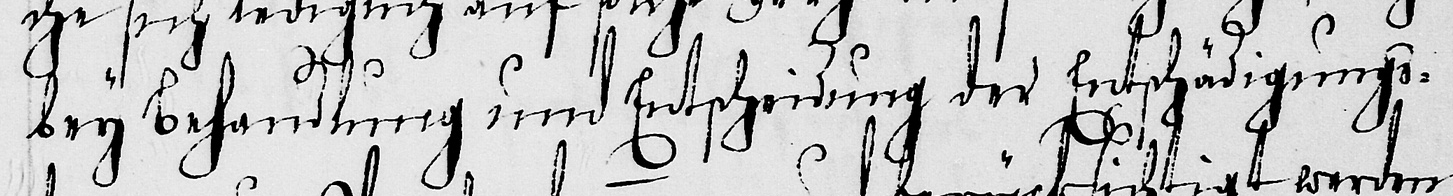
bey Behandlung und Entscheidung der Entschädigungs¬
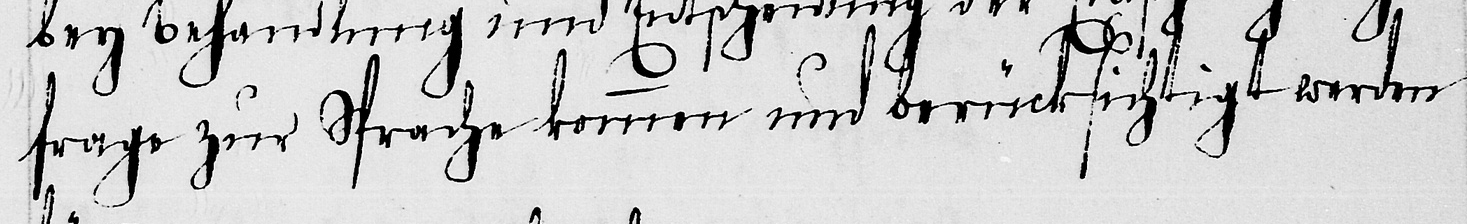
frage zur Sprache kommen und berücksichtigt werden
